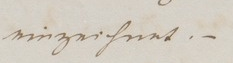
einzeichnet. –
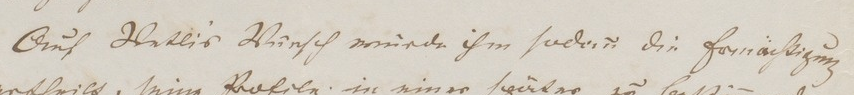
Auf Wetli's Wunsch wurde ihm sodann die Ermächtigung
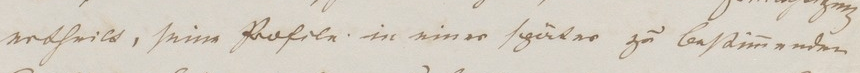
ertheilt, seine Profile in einer später zu bestimmenden
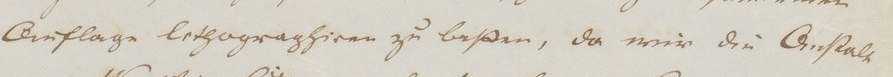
Auflage lithographiren zu laßen, da wir die Anstalt
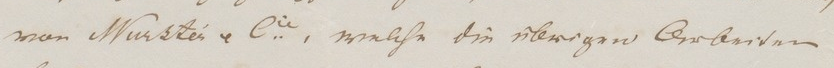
von Wurster & Cie , welche die übrigen Arbeiten
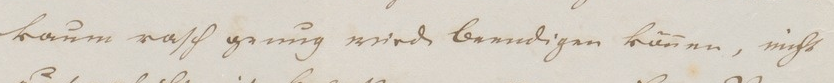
kaum rasch genug wird beendigen können, nicht
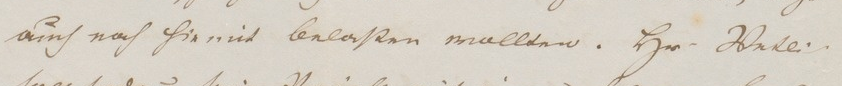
auch noch hiemit belasten wollten. Hr. Wetli
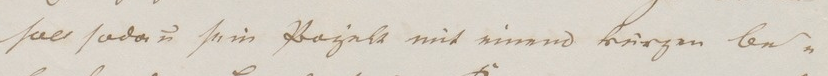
soll sodann sein Projekt mit einem kurzen be-
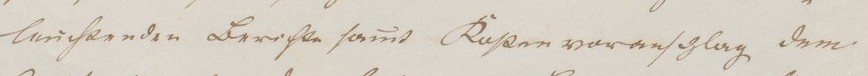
leuchtenden Berichte sammt Kostenvoranschlag dem
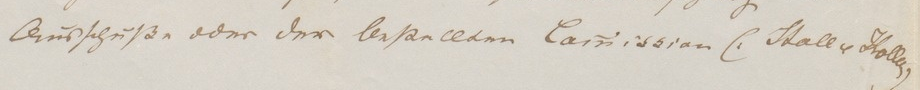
Ausschluße oder der bestellten Commission (Stoll & Koller
